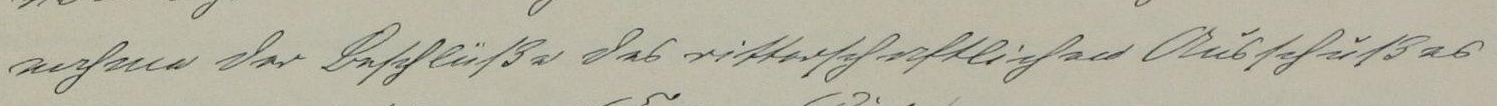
nahme der Beschlüße des ritterschaftlichen Ausschußes
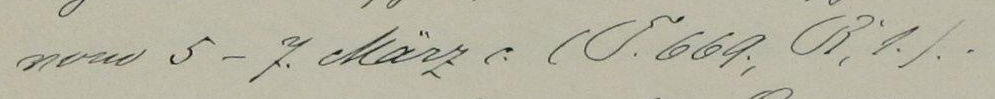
vom 5-7. März c. (T.669; R.1).
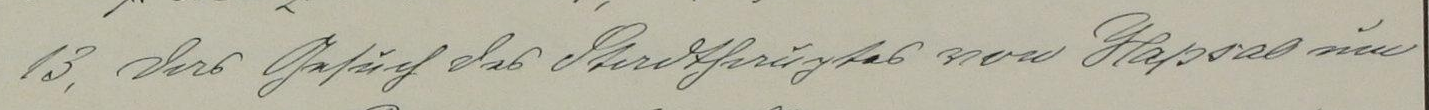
13. Das Gesuch des Stadthauptes von Hapsal um
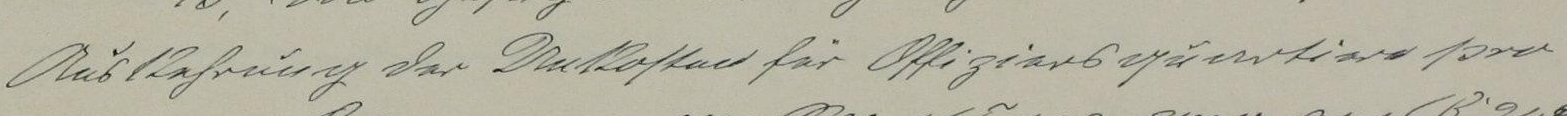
Auskehrung der Unkosten für Offiziersquartiere pro
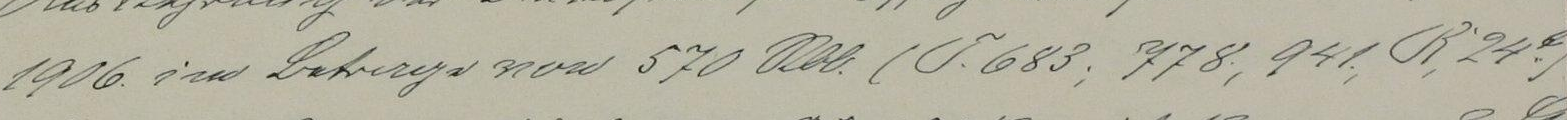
1906 im Betrage von 570 Rbl. (T.683; 778; 941; R.24t)
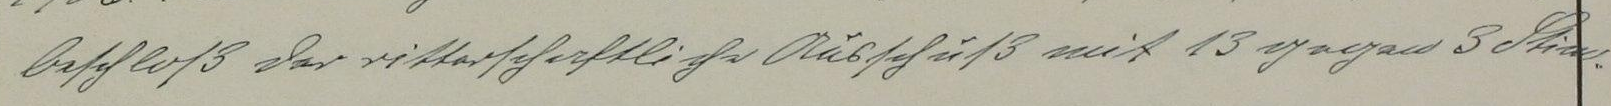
beschloß der ritterschaftliche Ausschuß mit 13 gegen 3 Stim-
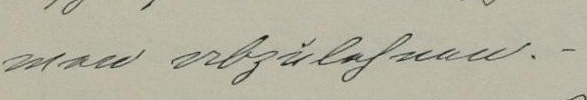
men abzulehnen.
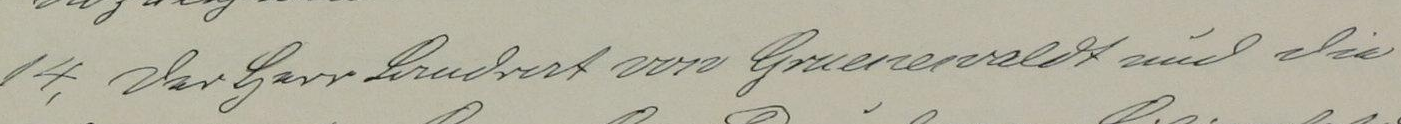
14. Der Herr Landrat von Gruenewaldt und die
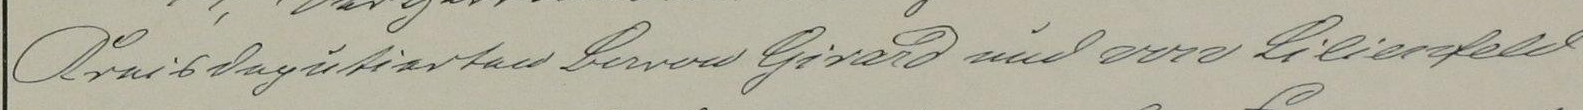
Kreisdeputierten Baron Girard und von Lilienfeld
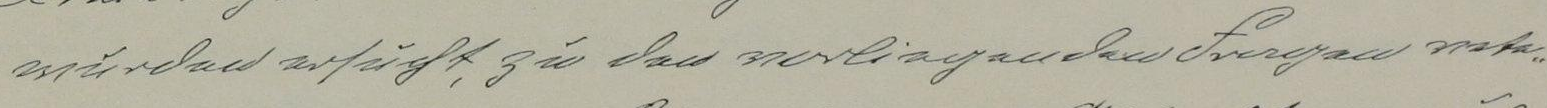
wurden ersucht, zu den vorliegenden Fragen vete-
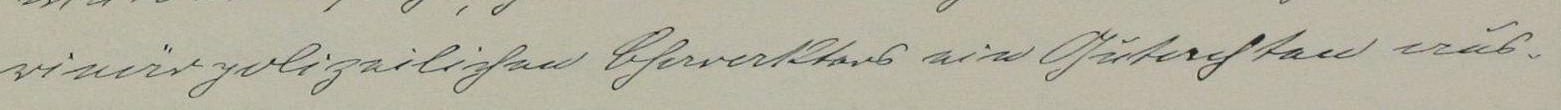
rinärpolizeilichen Charakters ein Gutachten aus-
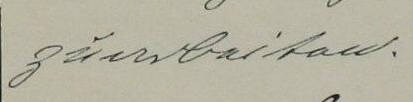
zuarbeiten.
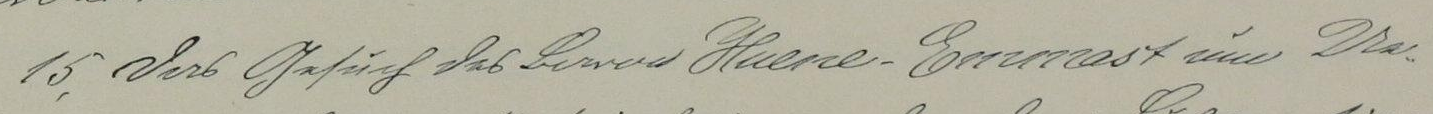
15. Das Gesuch des Baron Huene-Emmast um Ue-
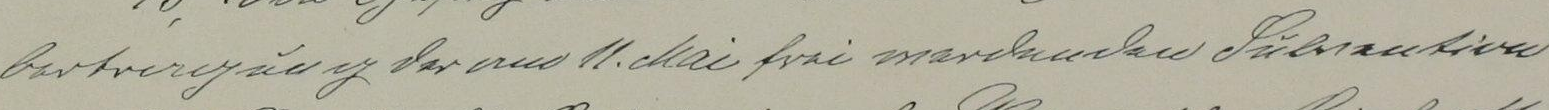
bertragung der am 11. Mai frei werdenden Subvention
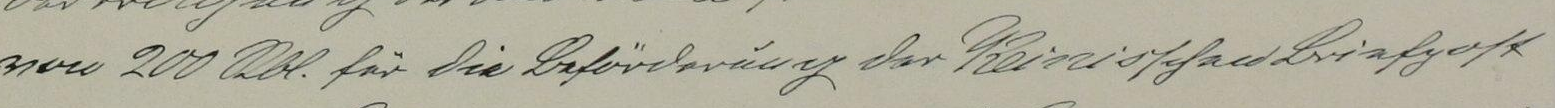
von 200 Rbl. für die Beförderung der Keinisschen Briefpost
